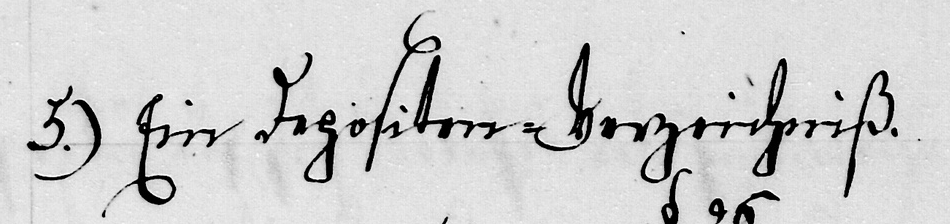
5.) Ein Depositen-Verzeichniß.
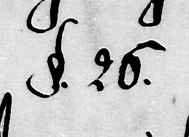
§. 26.
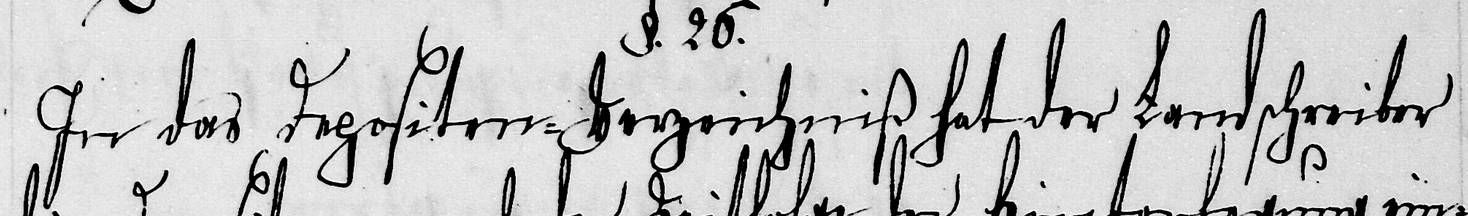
In das Depositen-Verzeichniß hat der Landschreiber
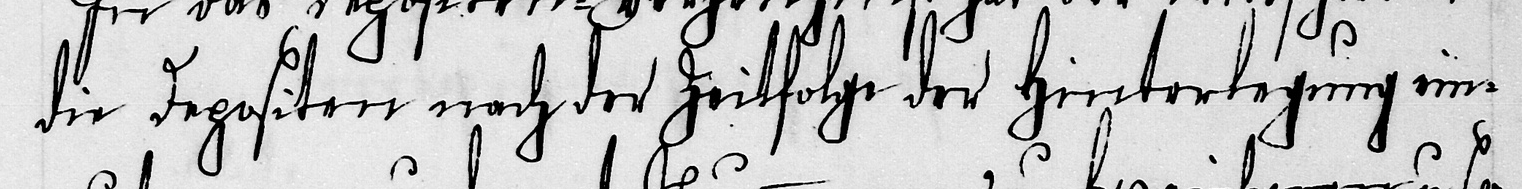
die Depositen nach der Zeitfolge der Hinterlegung ein¬
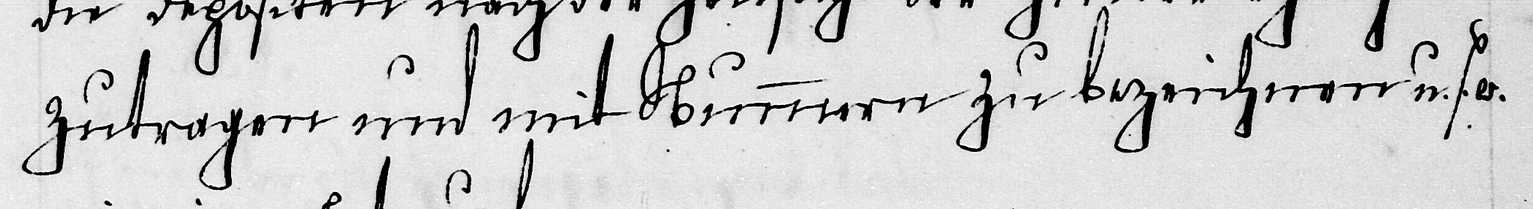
zutragen und mit Nummern zu bezeichnen u. s.
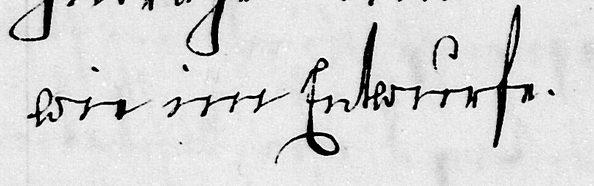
wie im Entwurfe.
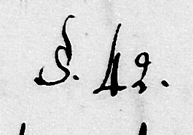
§. 42.
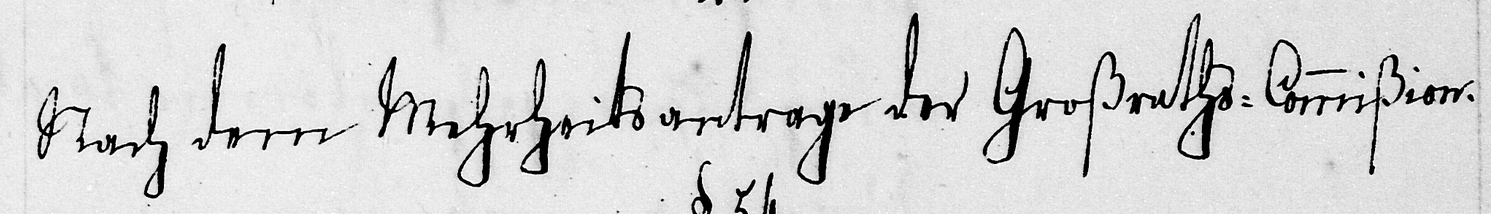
Nach dem Mehrheitsantrage der Großraths-Commißion.
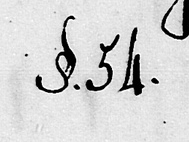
§. 54.
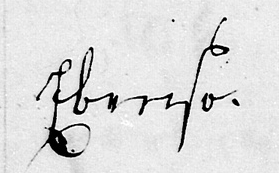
Ebenso.
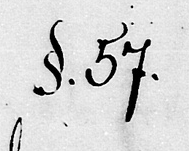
§. 57.
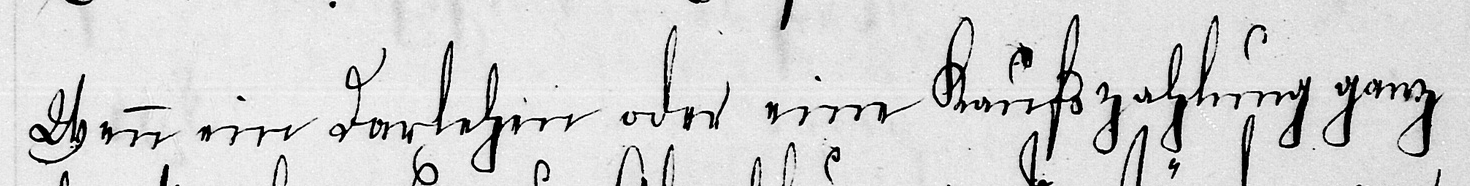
Wenn ein Darlehen oder eine Kaufszahlung ganz
